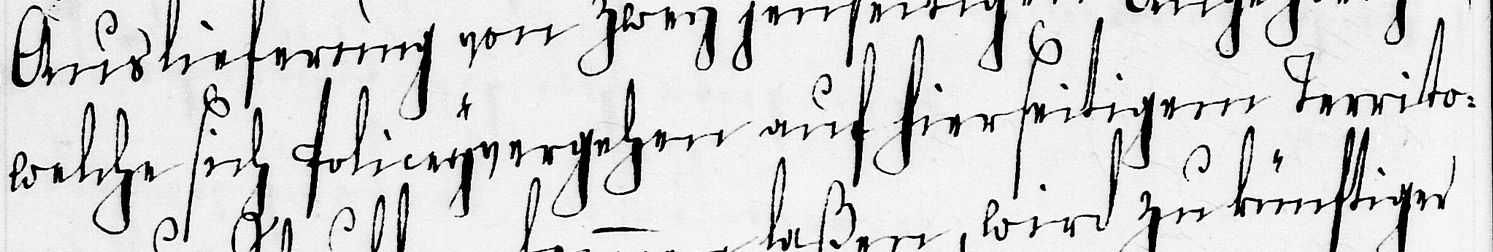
welche sich Policeyvergehen auf hierseitigem Territo¬
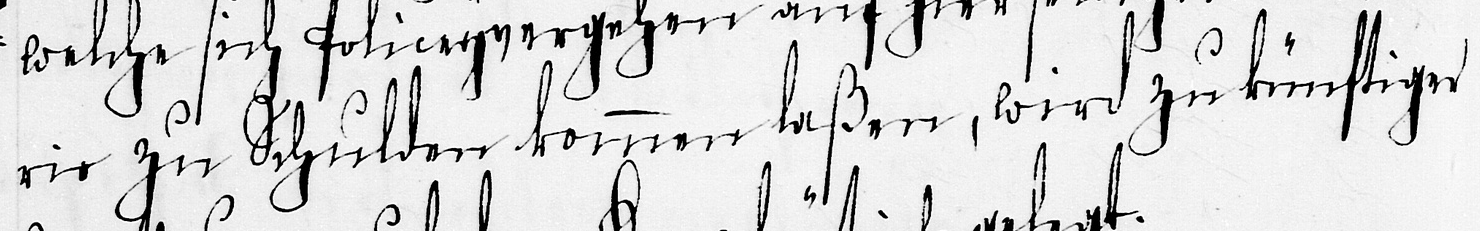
rie zu Schulden kommen laßen, wird zu künftiger
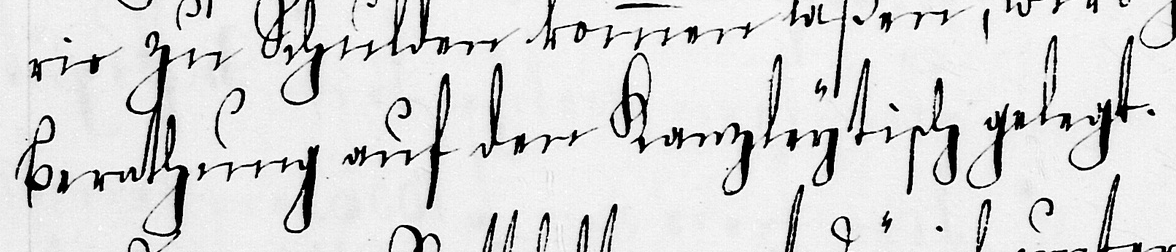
Berathung auf den Kanzleytisch gelegt.
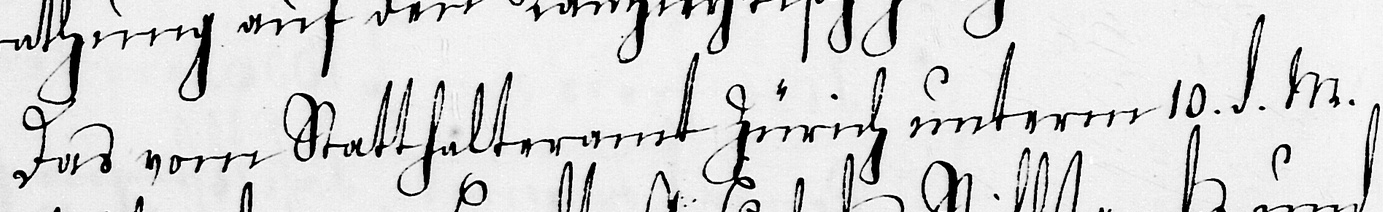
Das vom Statthalteramt Zürich unterm 10. d. M.
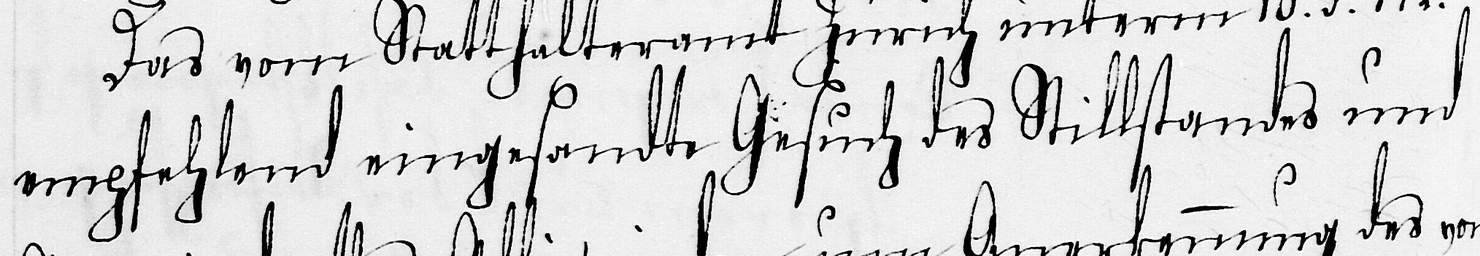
empfehlend eingesandte Gesuch des Stillstandes und
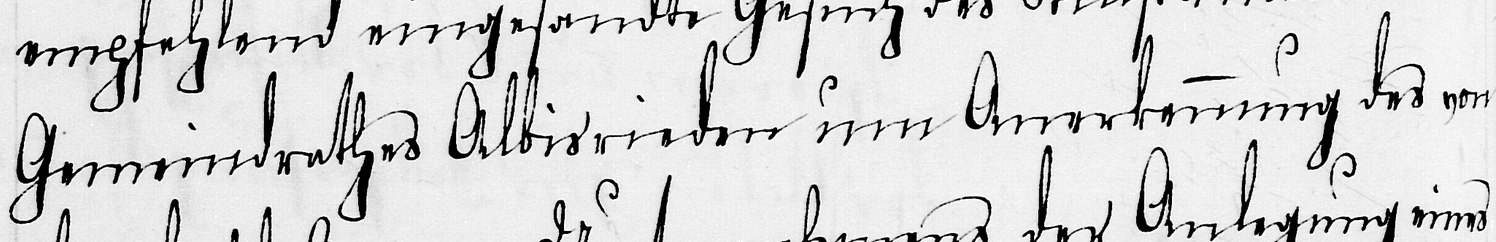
Gemeindrathes Albisrieden um Anerkennung des von
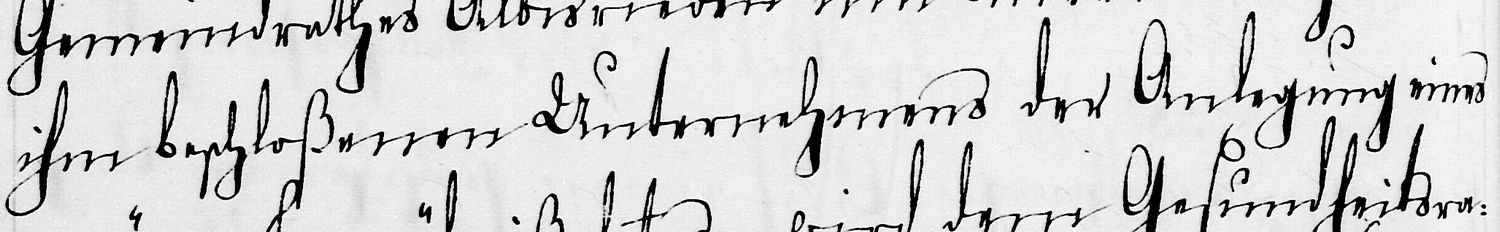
ihm beschloßenen Unternehmens der Anlegung eines
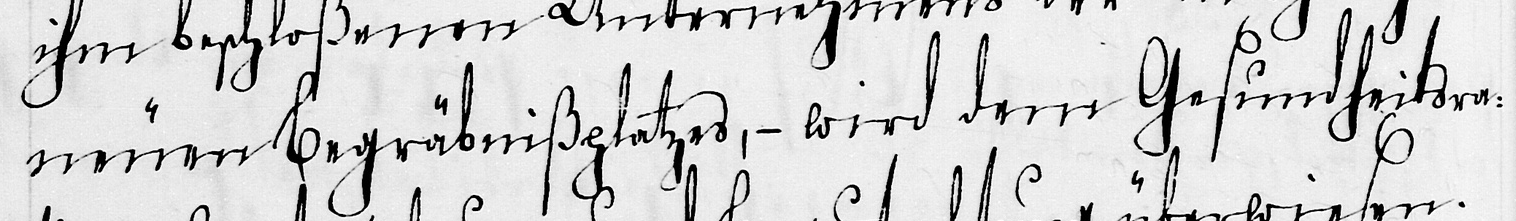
neuen Begräbnißplatzes, – wird dem Gesundheitsra¬
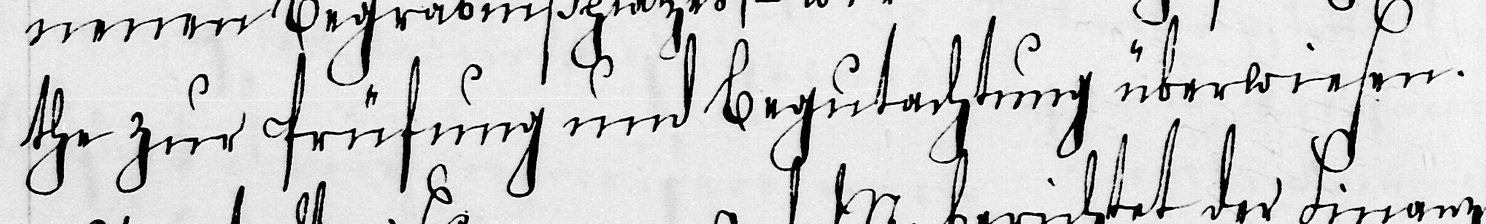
the zur Prüfung und Begutachtung überwiesen.
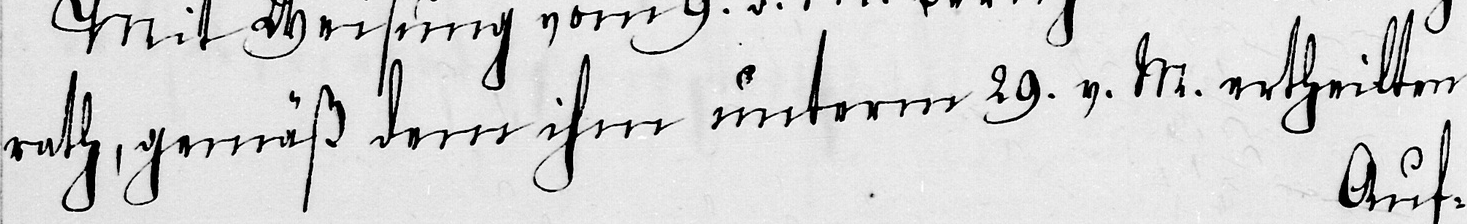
rath, gemäß dem ihm unterm 29. v. M. ertheilten
